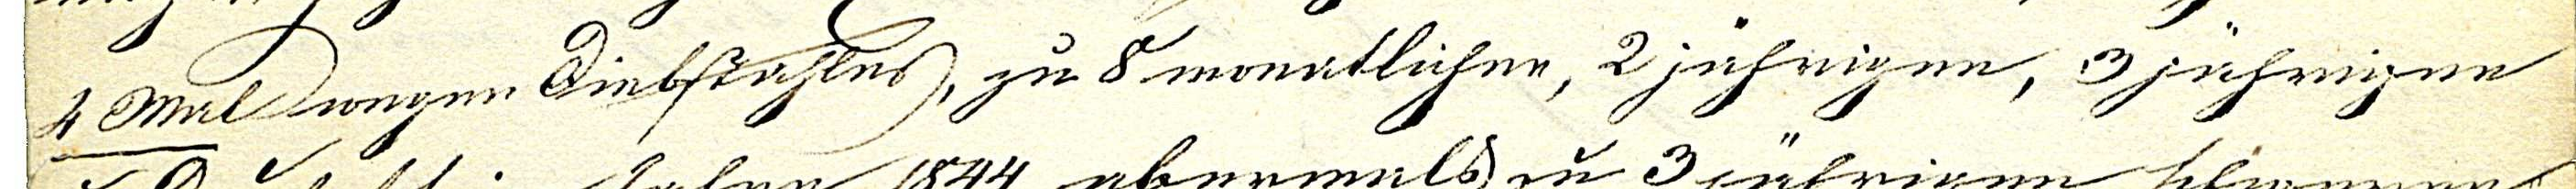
4mal wegen Diebstahles, zu 8monatlicher, 2jährigen, 3jährigen
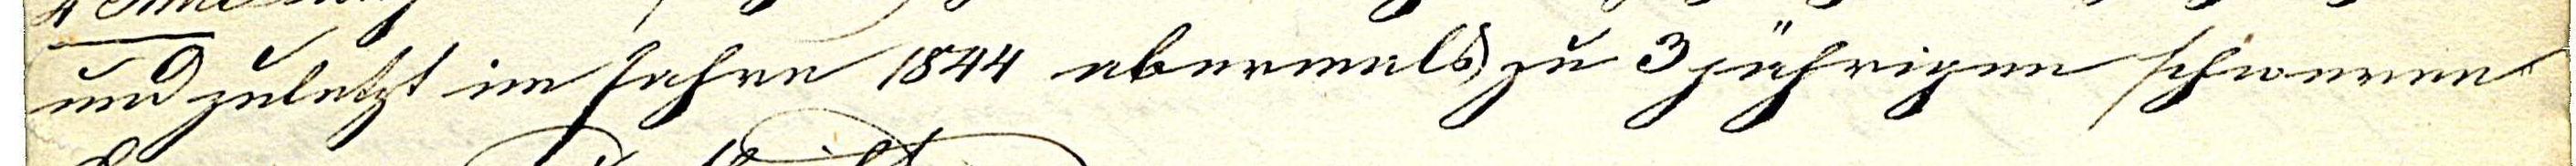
und zuletzt im Jahre 1844 abermals zu 3jährigen schweren
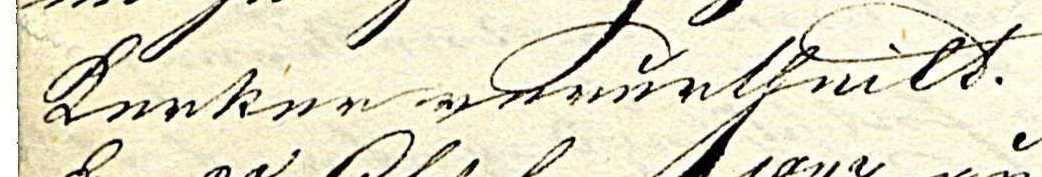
Kerker verurtheilt.
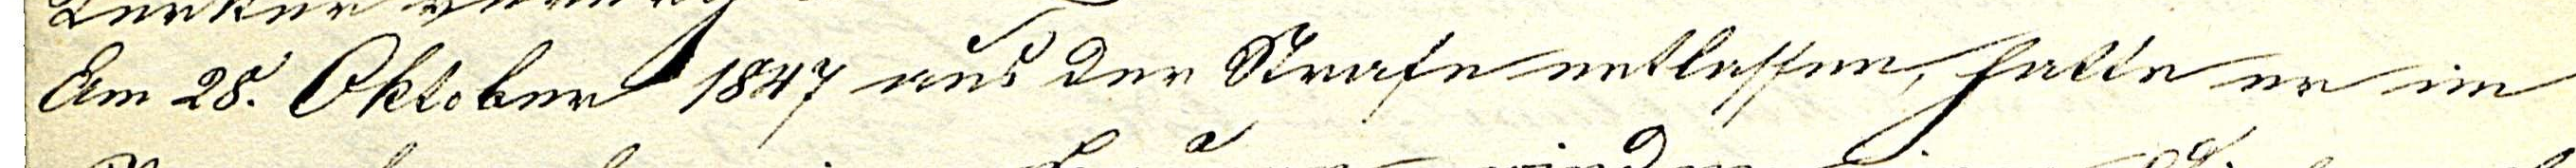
Am 28. Oktober 1847 aus der Strafe entlassen, hatte er im
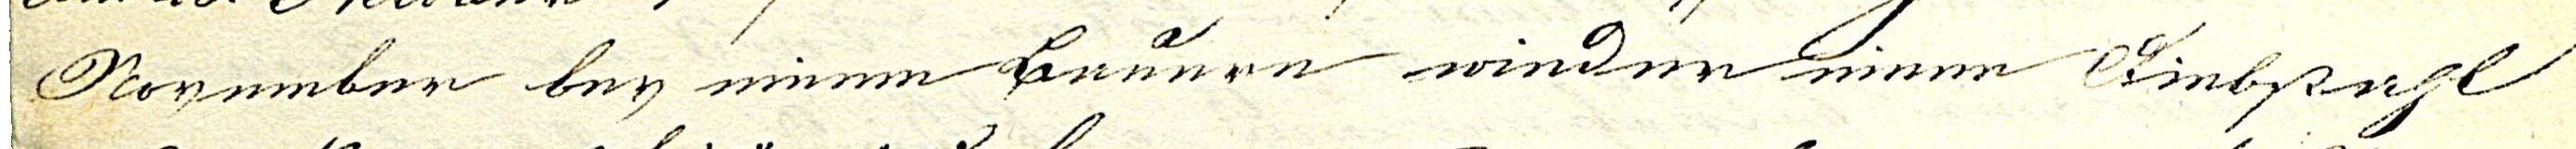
November bey einem Bauern wieder einer Diebstahl
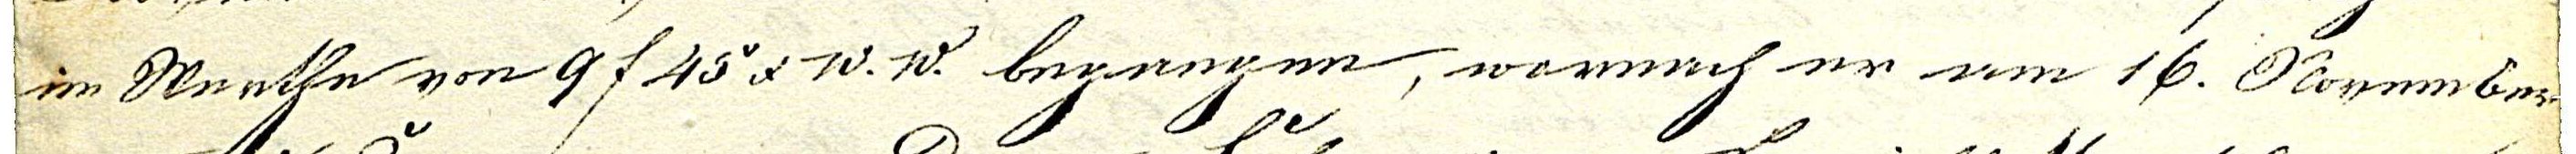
im Werthe von 9f45x WW begangen, wornach er am 16. November
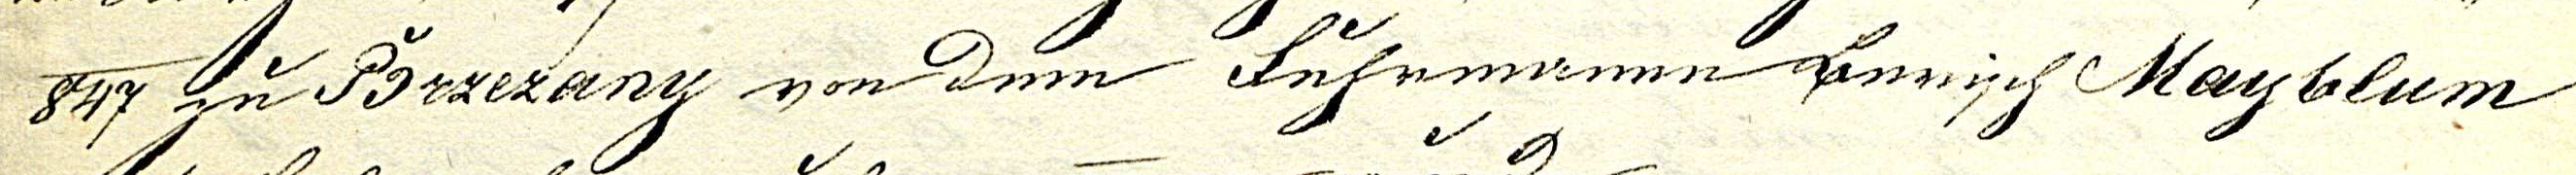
1847 zu Brzezany von dem Fuhrmann Berisch Mayblum
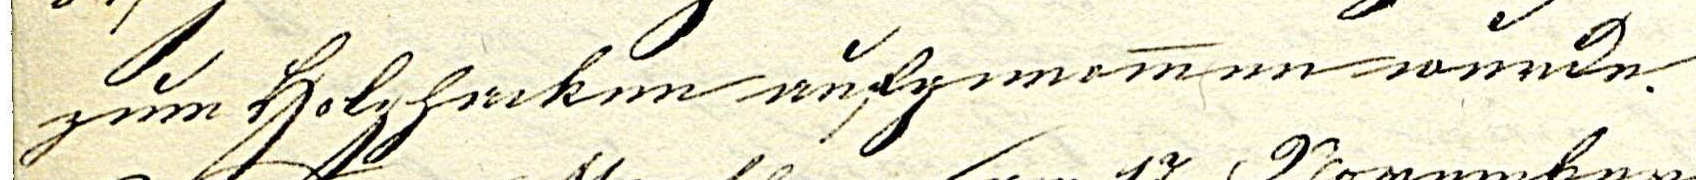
zum Holzhacken aufgenommen wurde.
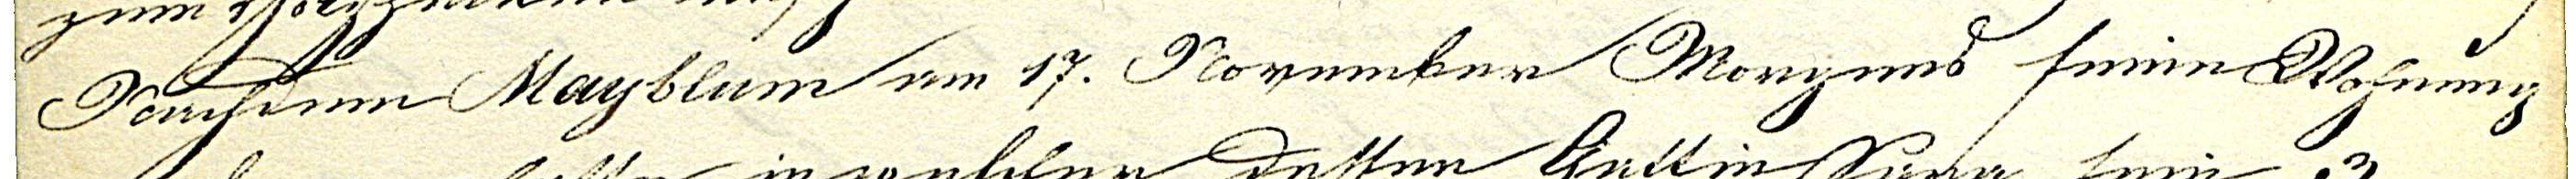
Nachdem Mayblum am 17. November Morgens seine Wohnung
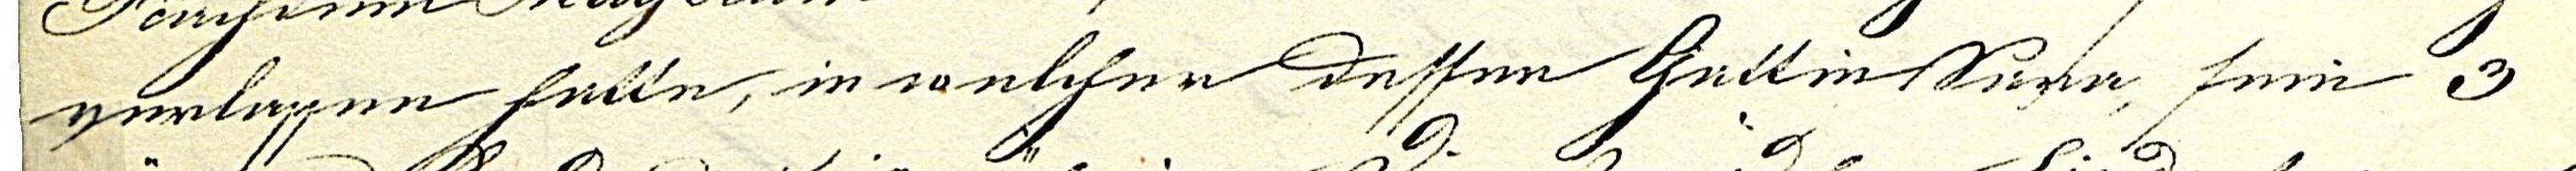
verlassen hatte, in welcher dessen Gattin Sara, sein 3
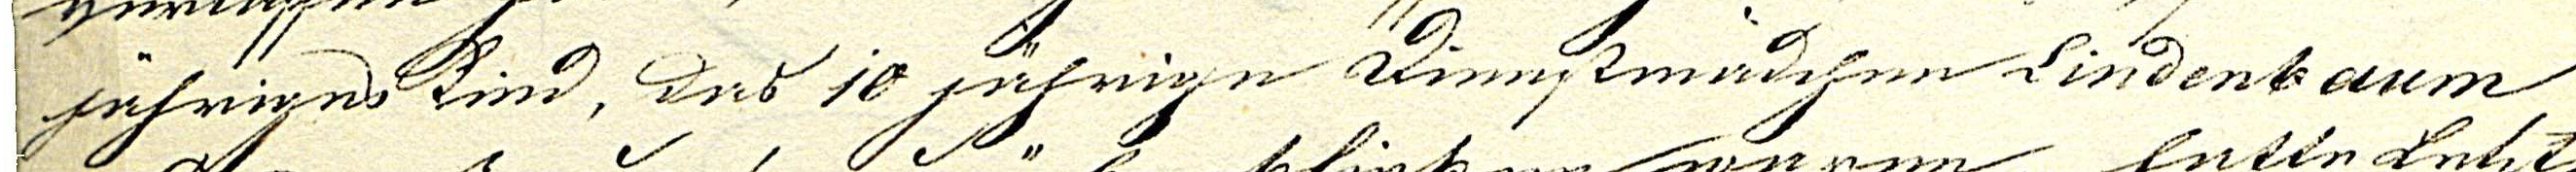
jähriges Kind, das 10jährige Dienstmädchen Lindenbaum
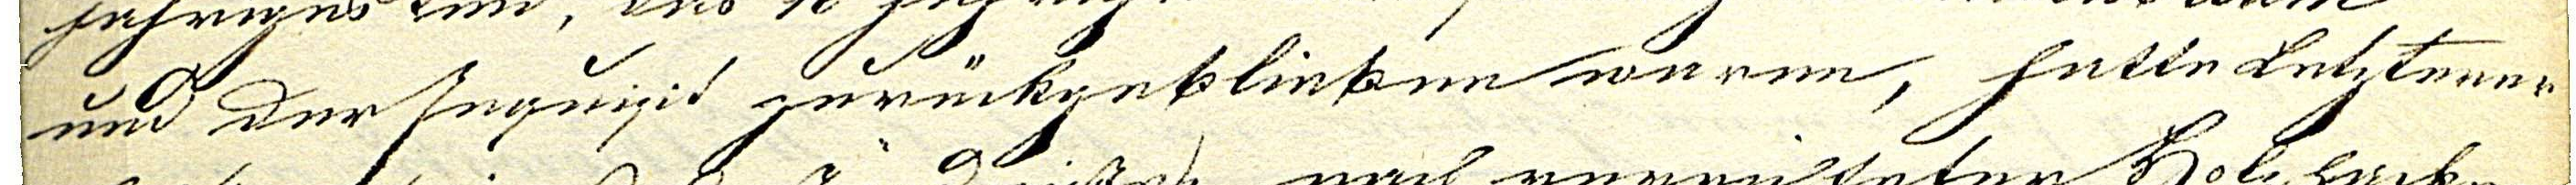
und der Inquisit zurückgeblieben waren, hatte Letzterer
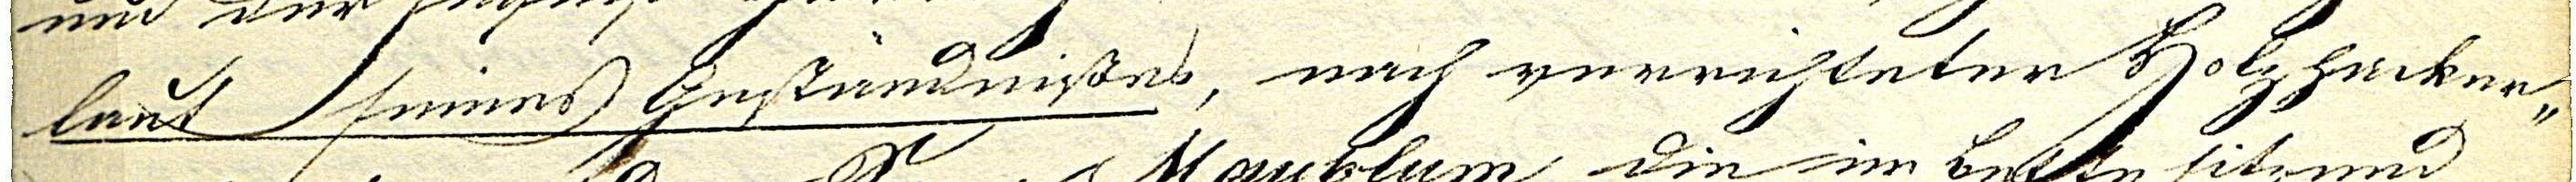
laut seines Geständnißes, nach verrichteten Holzhacker¬
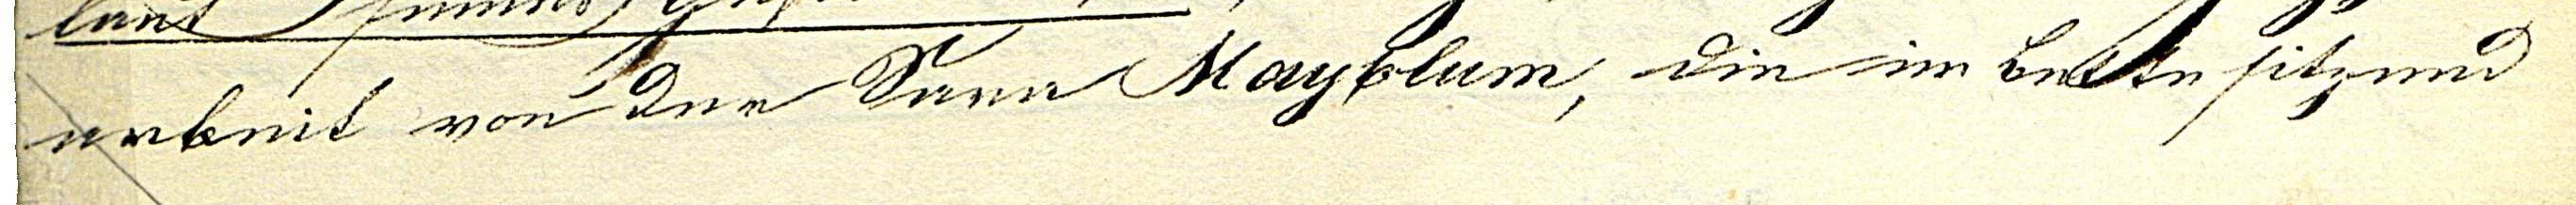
arbeit von der Sara Mayblum, die im Bette sitzend
